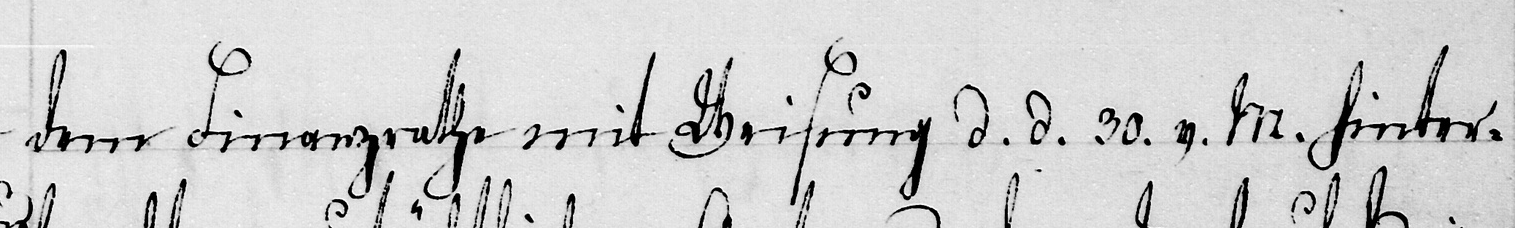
dem Finanzrathe mit Weisung d. d. 30. v. M. hinter¬
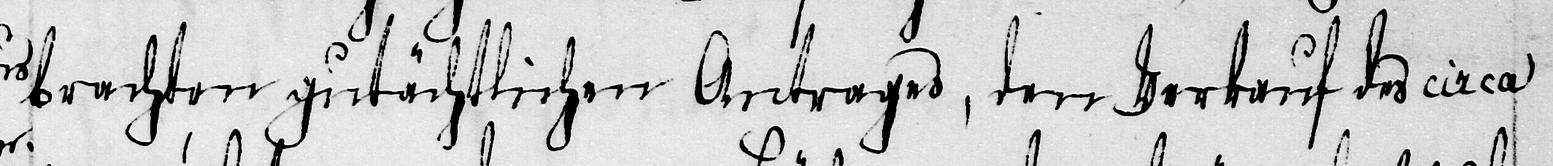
brachten gutächtlichen Antrages, den Verkauf des circa
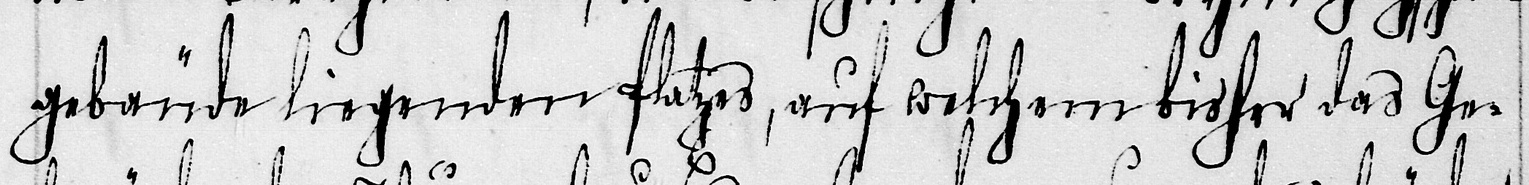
gebäude liegenden Platzes, auf welchem bisher das Ge¬
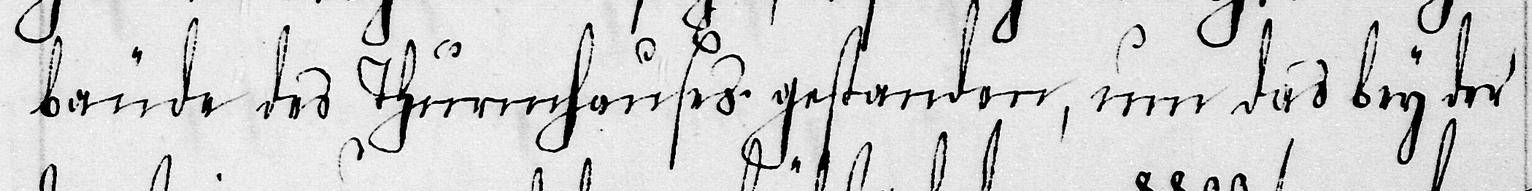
bäude des Thurmhauses gestanden, um das bey der
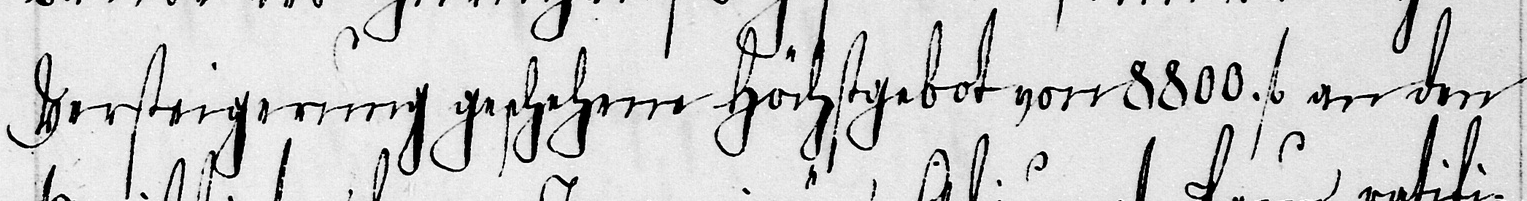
Versteigerung geschehene Höchstgebot von 8800. fl. an den
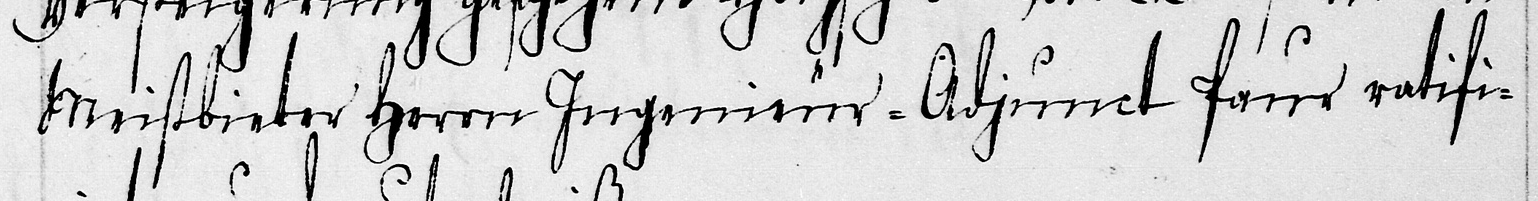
Meistbieter Herrn Ingenieur-Adjunct Paur ratifi¬
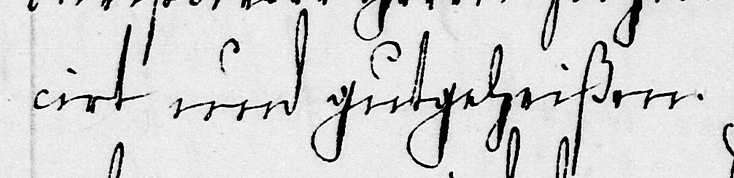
cirt und gutgeheißen.
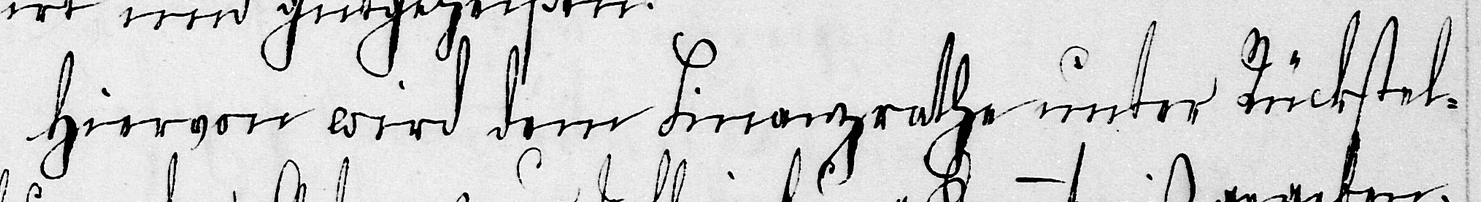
Hiervon wird dem Finanzrathe unter Rückstel¬
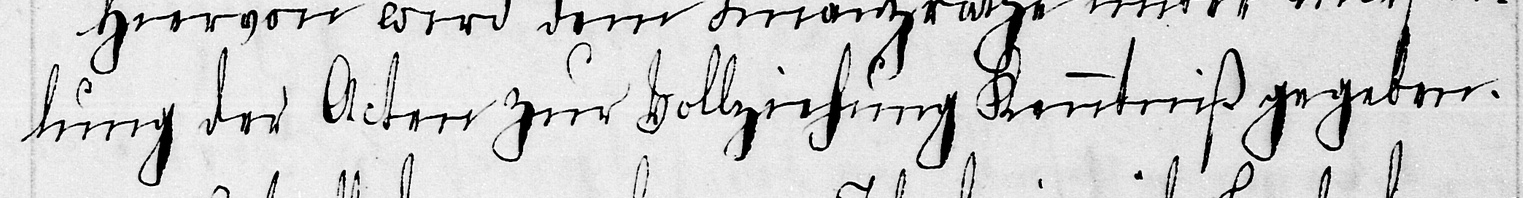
lung der Acten zur Vollziehung Kenntniß gegeben.
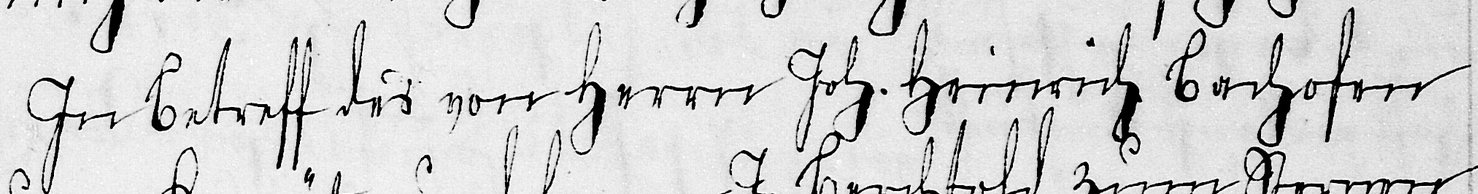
In Betreff des von Herrn Joh. Heinrich Bachofen
